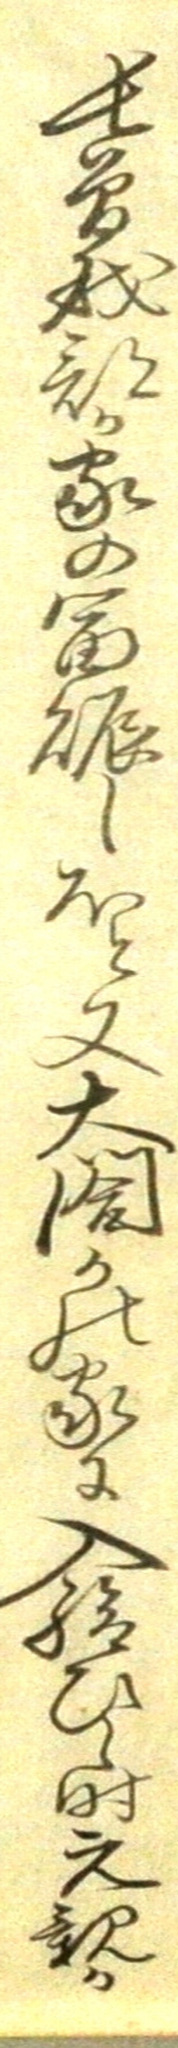長曾我部か家の富賑しほと又太閤かの家に入給ひし時元親か
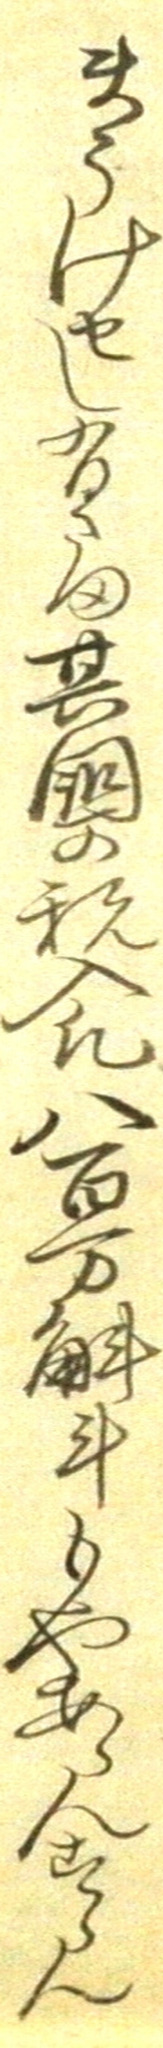まうけせし有さま其国の税入凡八百万斛計もやあらんすらん
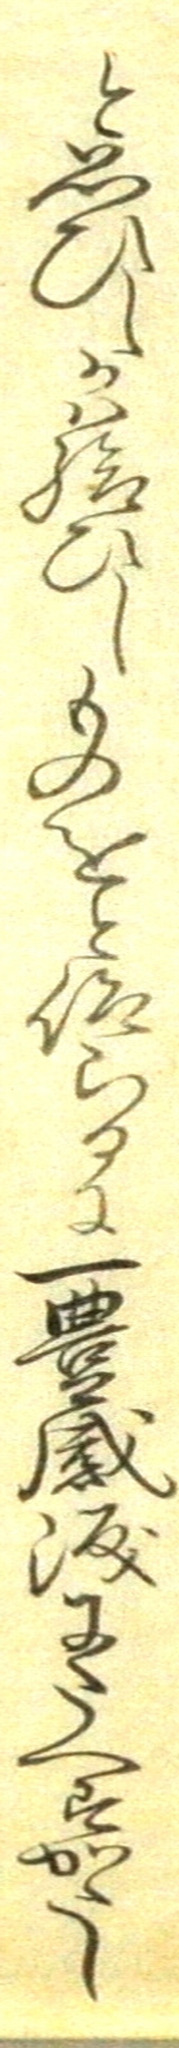とおもひしかは給ひしものをと仰らるに一豊感涙にたへすかたし
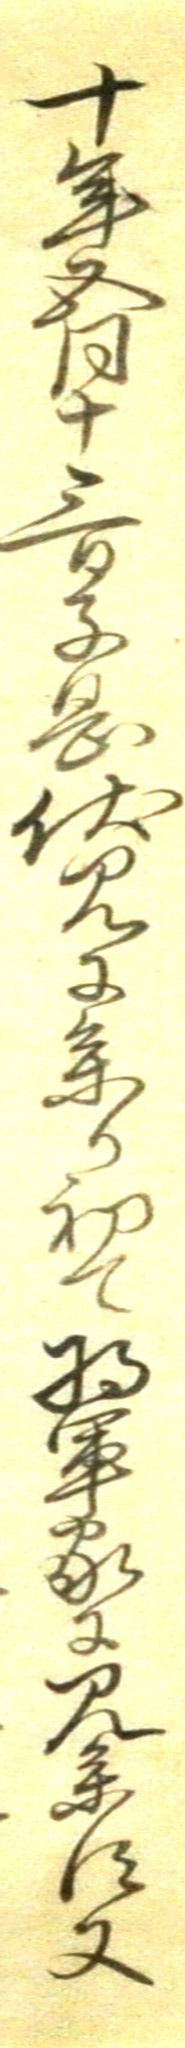十年五月十三日子息伏見に参り初て将軍家に見参す又
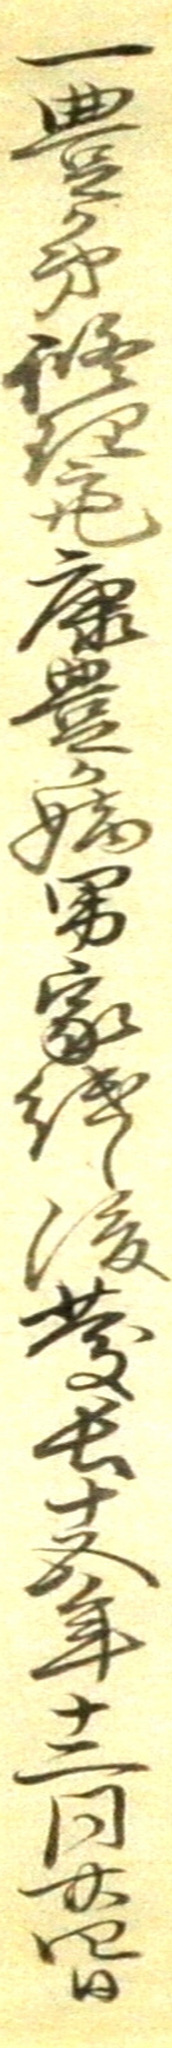一豊か弟修理亮康豊か嫡男家継し後慶長十五年十二月廿四日
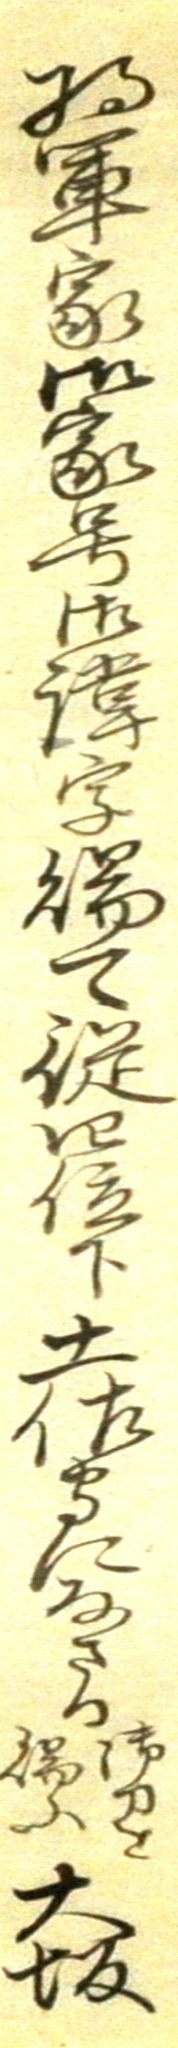将軍家御家号御諱字賜て従四位下土佐守になさる御刀を賜ふ大坂
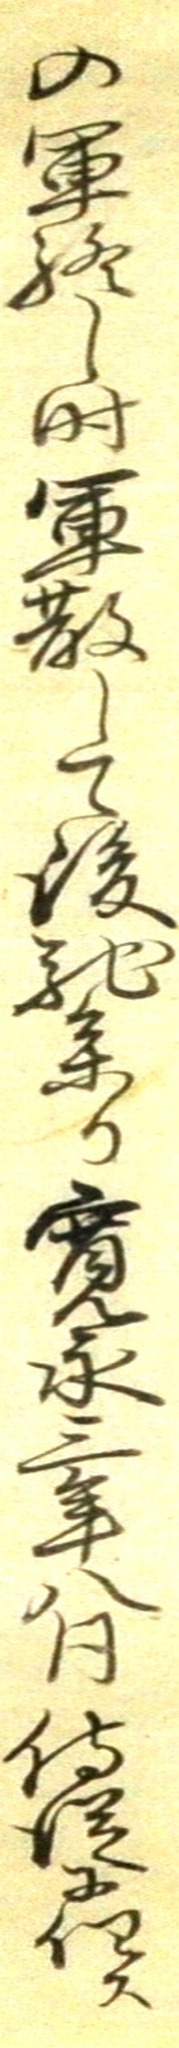の軍終し時軍散して後馳参り寛永三年八月侍従に任ス
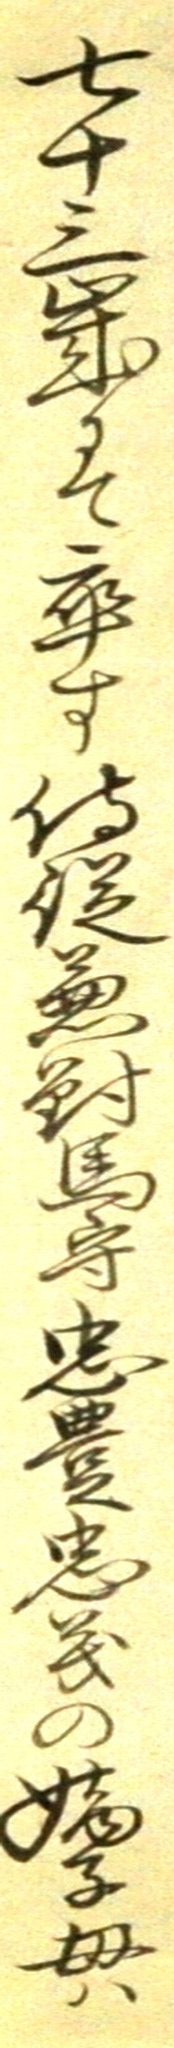七十三歳にて卒す侍従兼対馬守忠豊忠義の嫡子母は
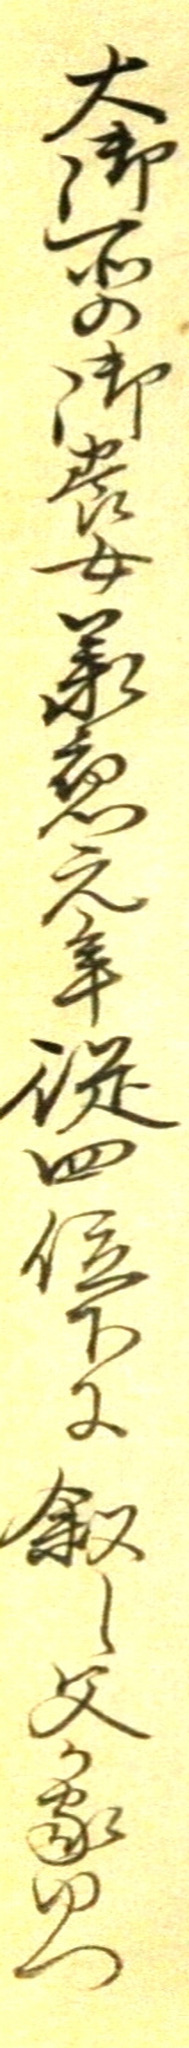大御所の御養女承応元年従四位下に叙し父か家ゆつ

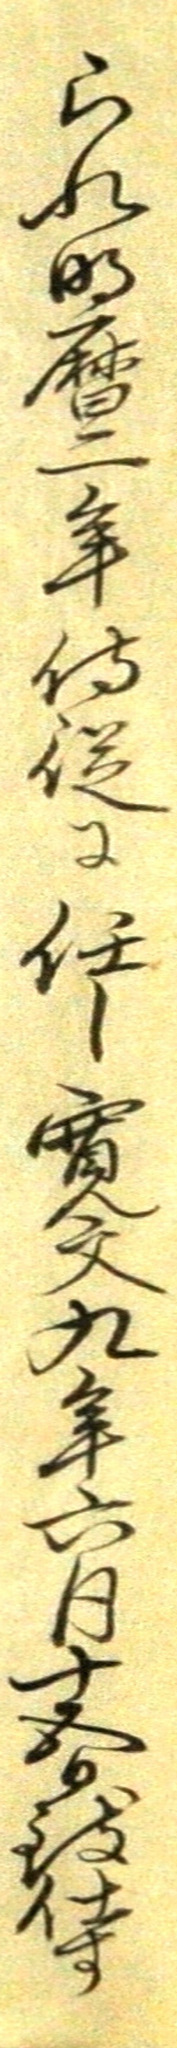られ明暦二年侍従に任し寛文九年六月十五日致仕す
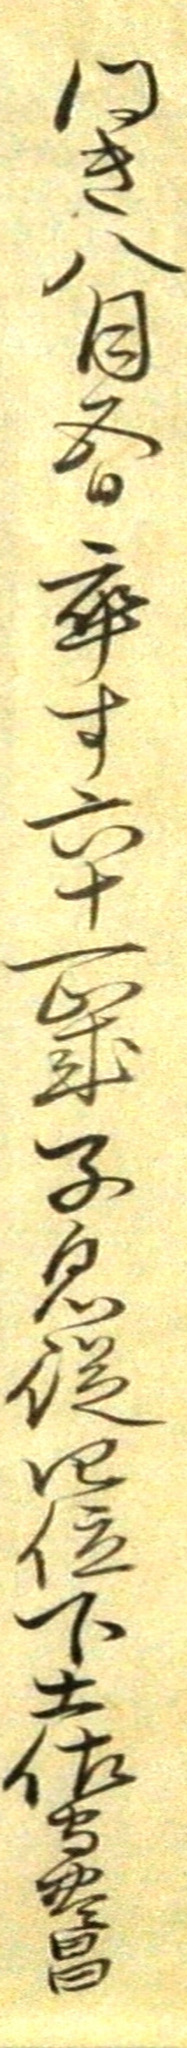同き八月五日卒す六十一歳子息従四位下土佐守豊昌
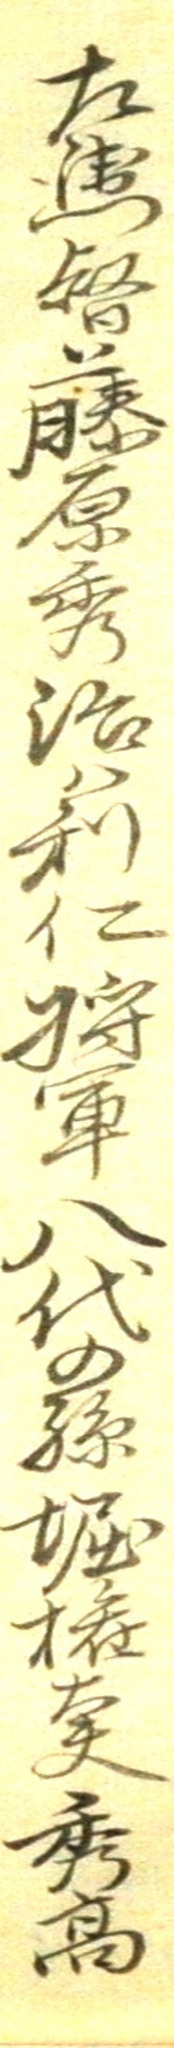左衛門督藤原秀治は利仁将軍八代の孫堀権大夫秀高
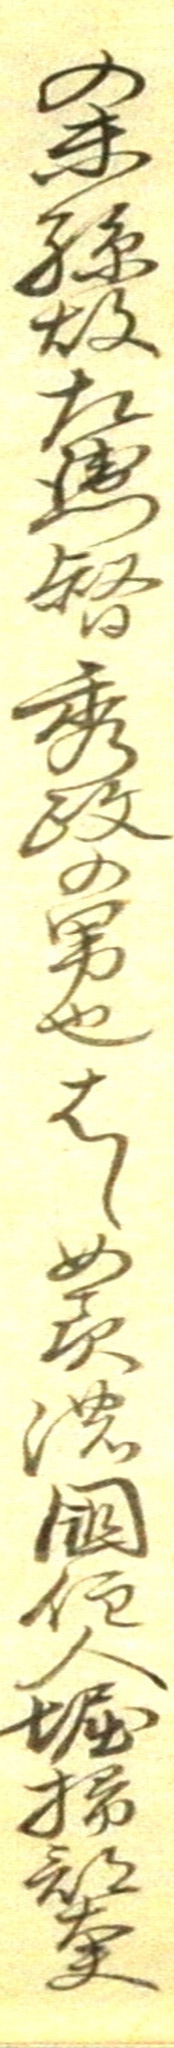の末孫故左衛門督秀政の男也はしめ美濃国住人堀掃部大夫
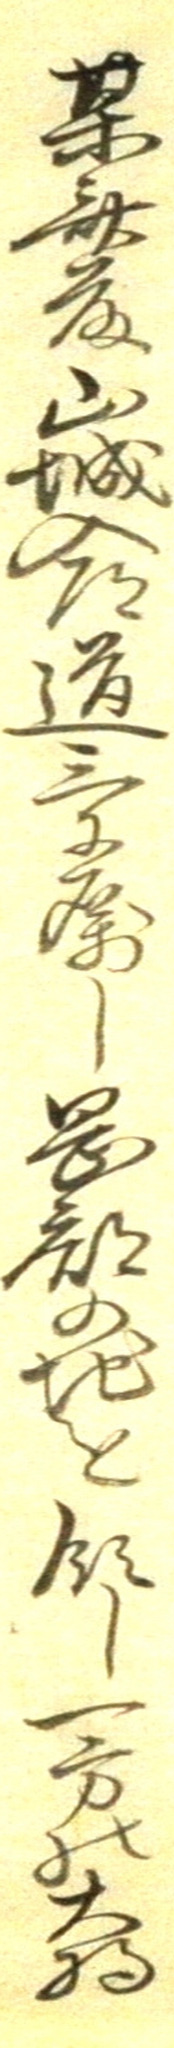某斎藤山城入道道三に属し岡部の地を領し一方の大将
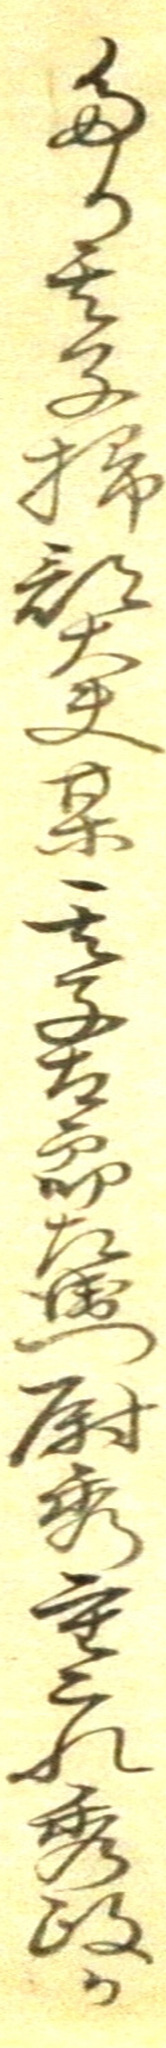たり其子掃部大夫某其子太郎左衛門尉秀重これ秀政か
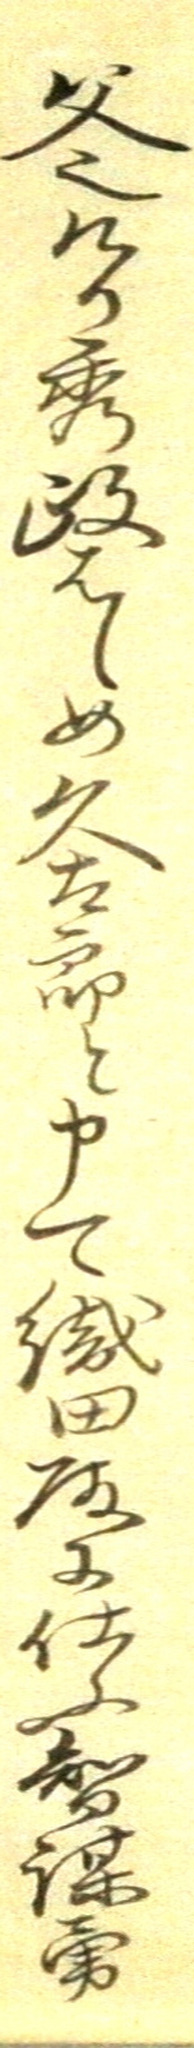父也けり秀政はしめ久太郎と申て織田殿に仕ふ智謀勇
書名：藩翰譜（七・上）
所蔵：伊那市立高遠町図書館・合同会社AMANE
